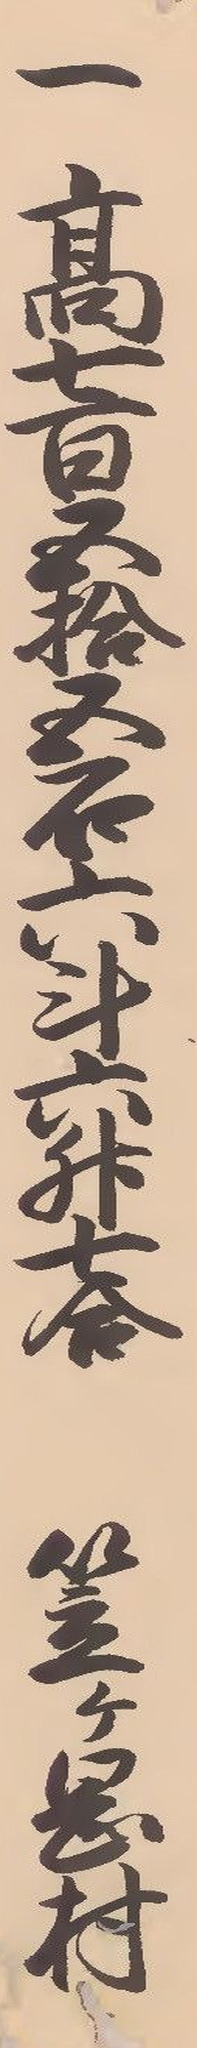一高七百五拾五石六斗六升七合笠ヶ岡村
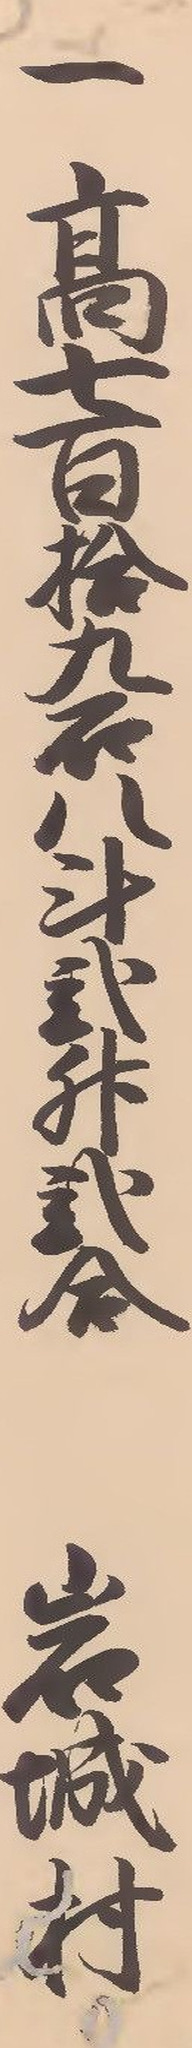一高七百拾九石八斗弐升弐合岩城村
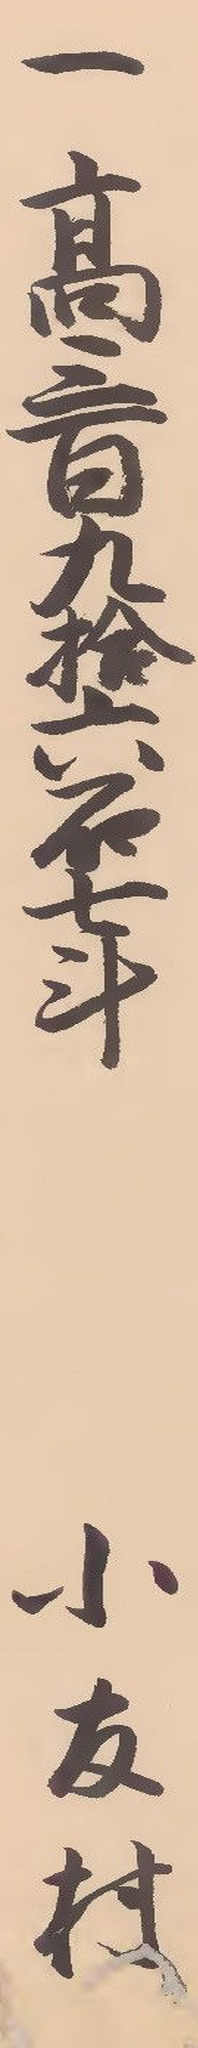一高三百九拾六石七斗小友村

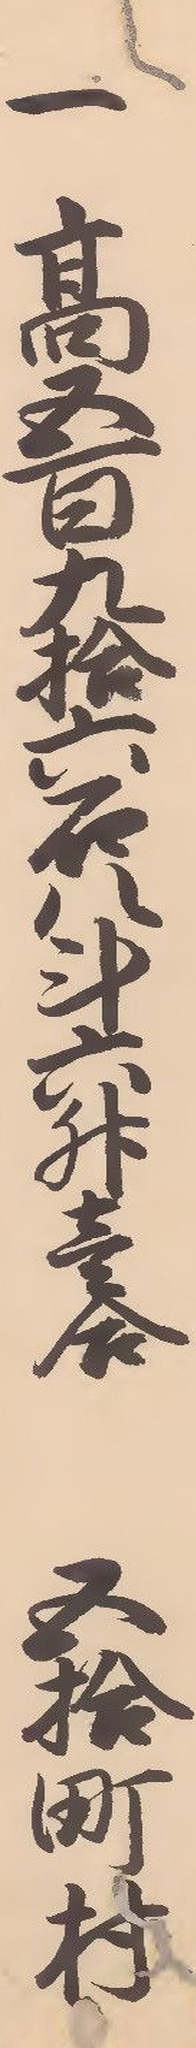一高五百九拾六石八斗六升壱合五拾町村
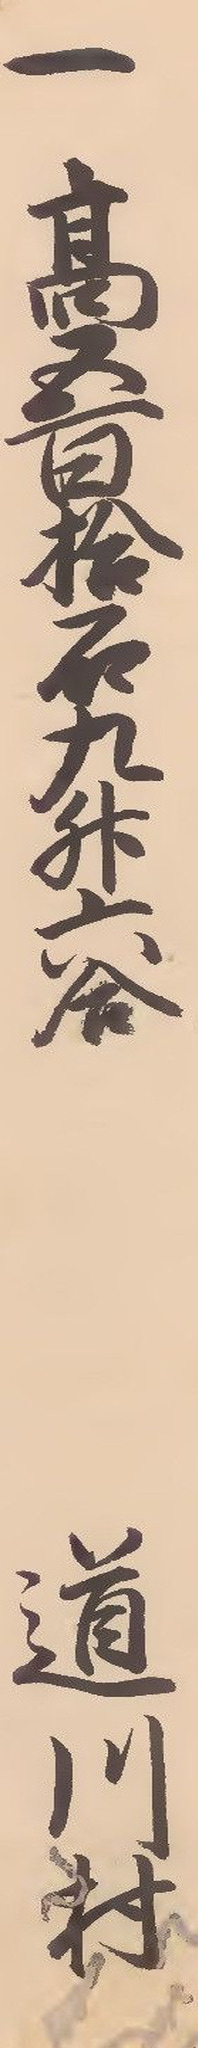一高五百拾石九升六合道川村
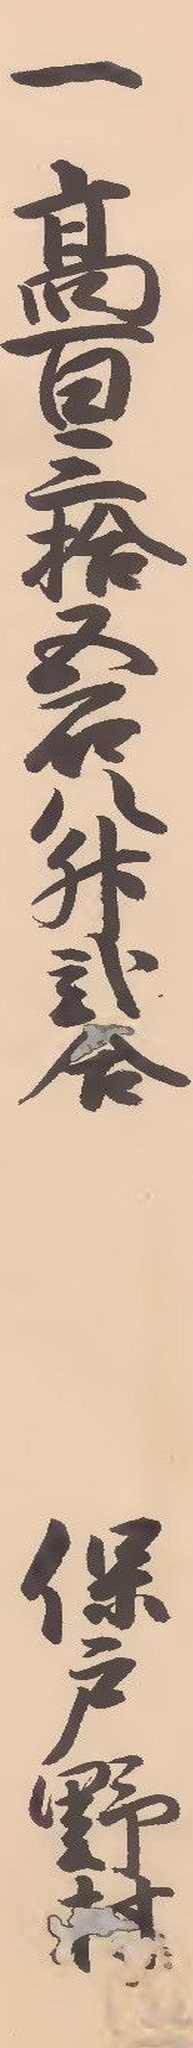一高百三拾五石八升弐合保戸野村
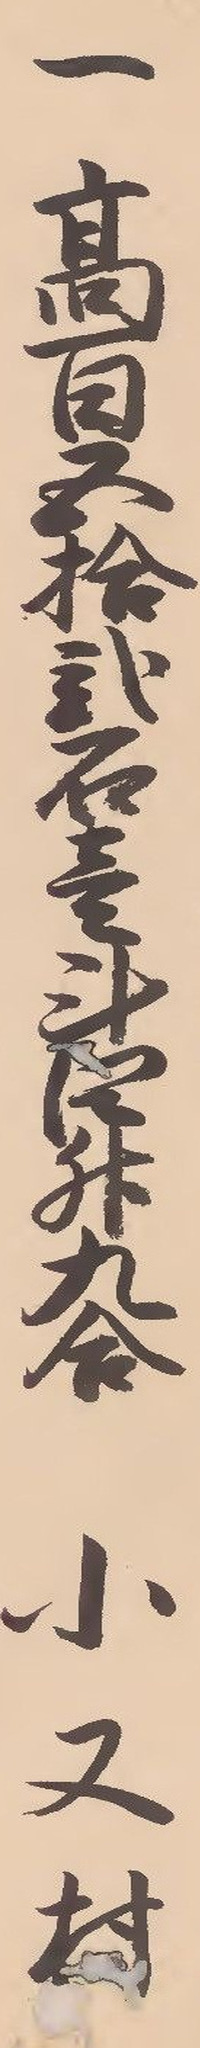一高百五拾弐石壱斗四升九合小又付
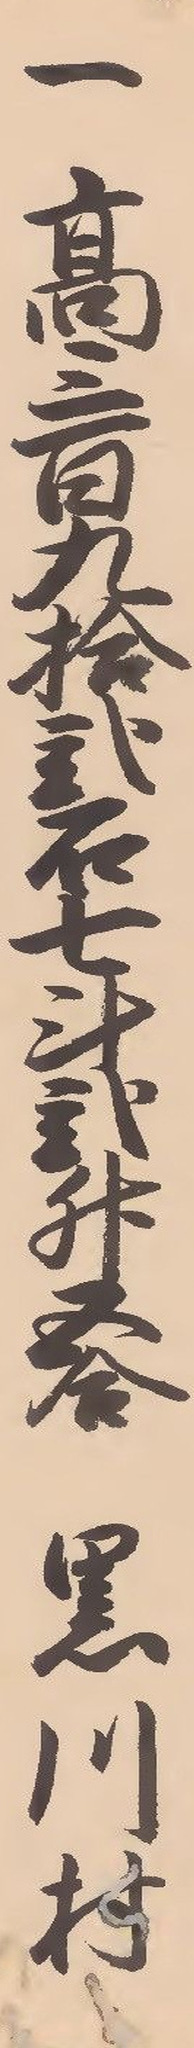一高三百九拾弐石七斗弐升五合黒川村
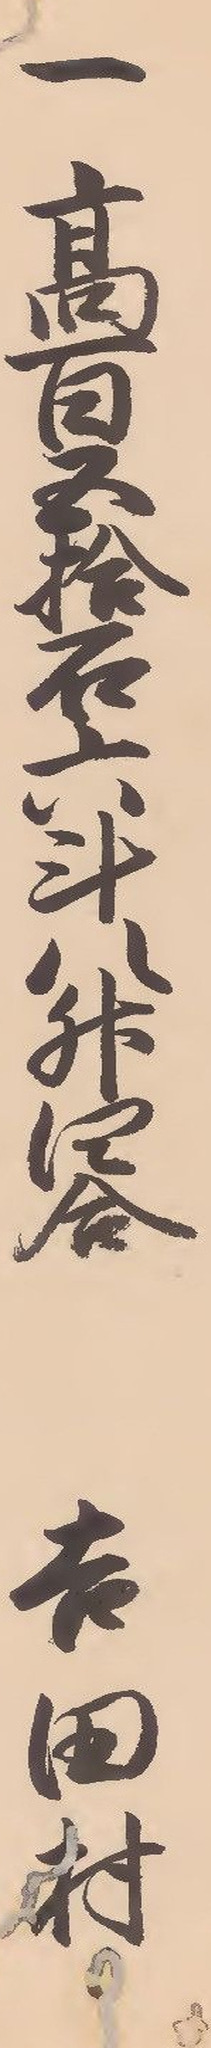一高百五拾石六斗八升四合吉田村
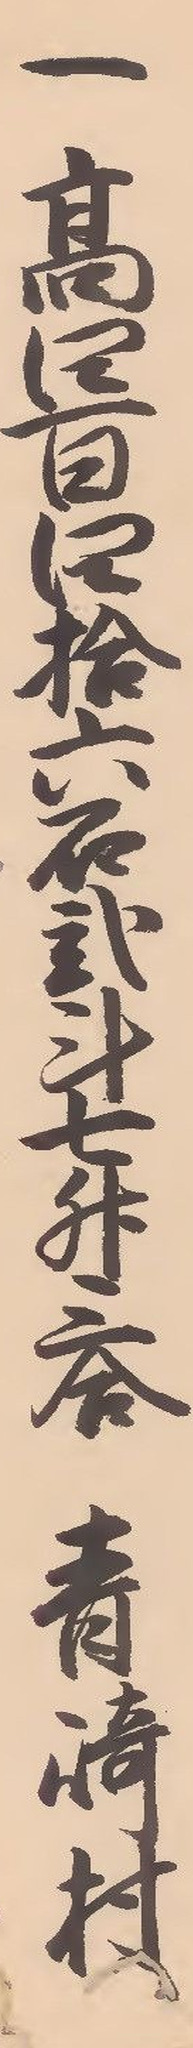一高四百四拾六石弐斗七升三合青崎村

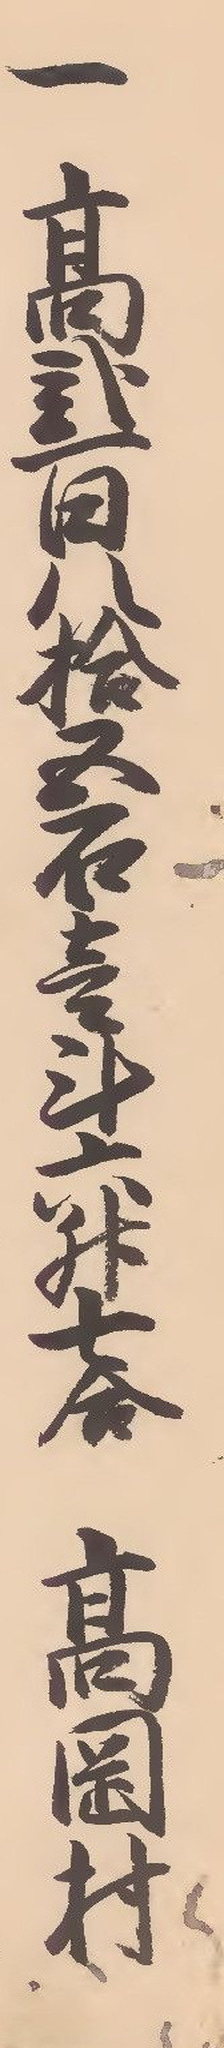一高弐百八拾五石壱斗弐六升七合高岡村
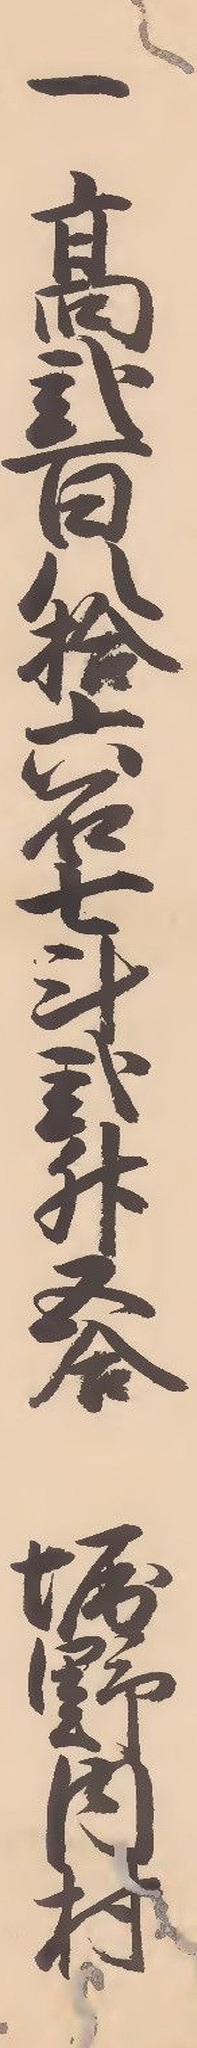一高弐百八拾六石七斗弐升五合堀野内村
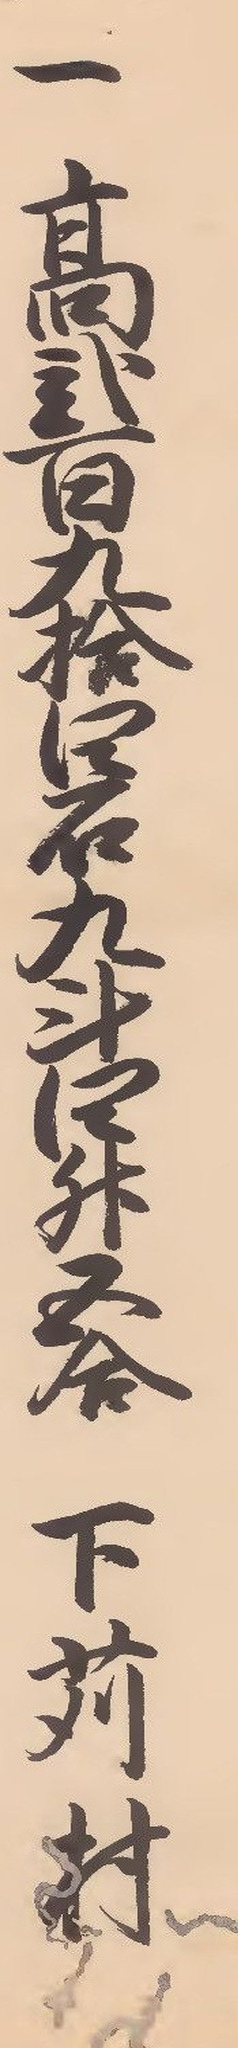一高弐百九拾四石九斗四升五合下苅村
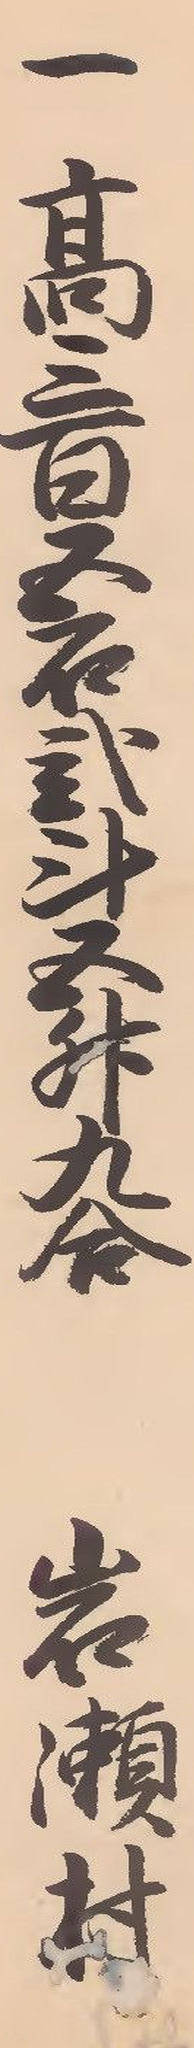一高三百五右弐斗五升九合岩瀬村
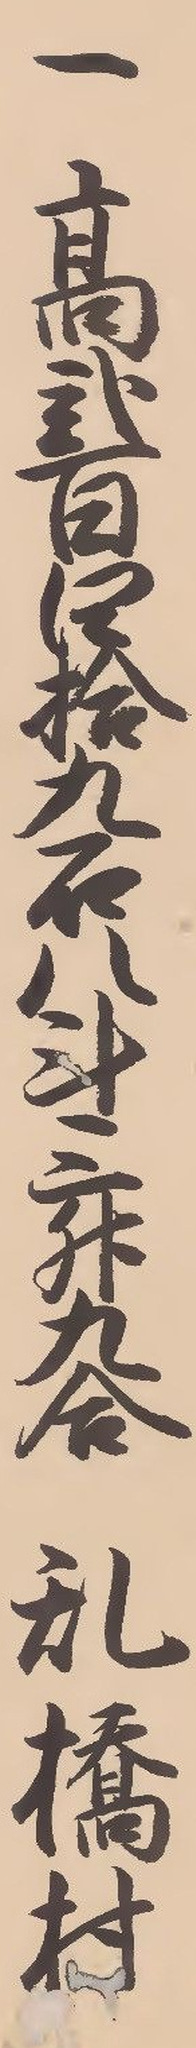一高弐百四拾九石八斗三升九合乱橋村
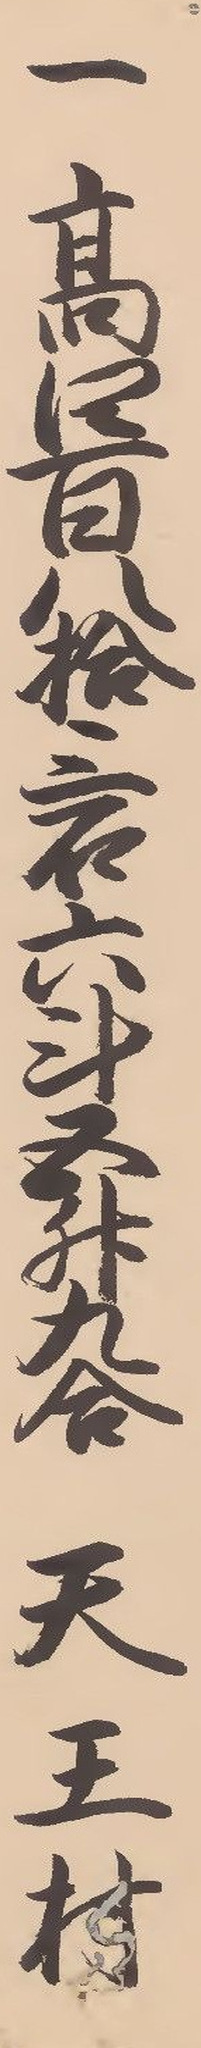一高四百八拾三石六斗五升九合天王村
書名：出羽国郷帳　５
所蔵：国立公文書館 National Archives of Japan
